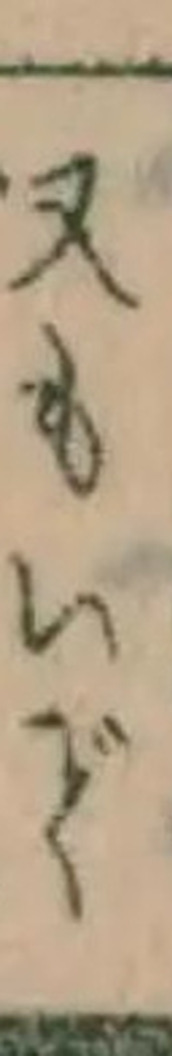又もいで
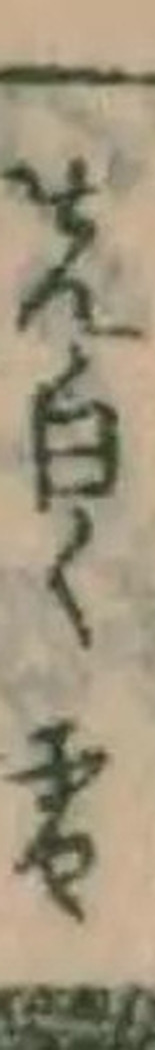先白く雪
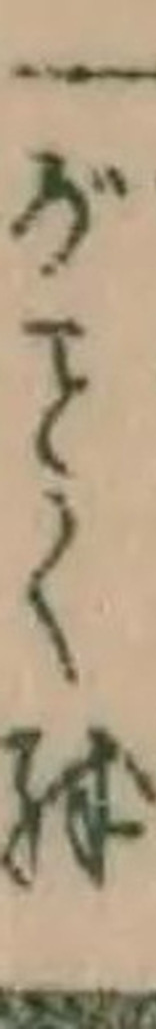がことく殊
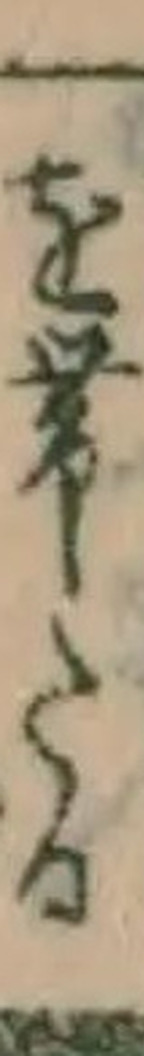を帯たる
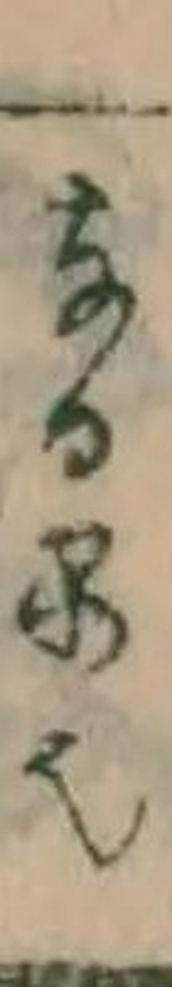なる品也
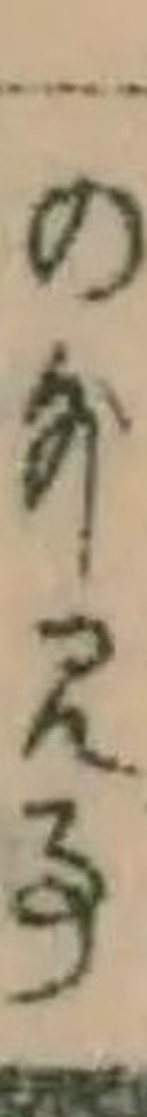の外見事
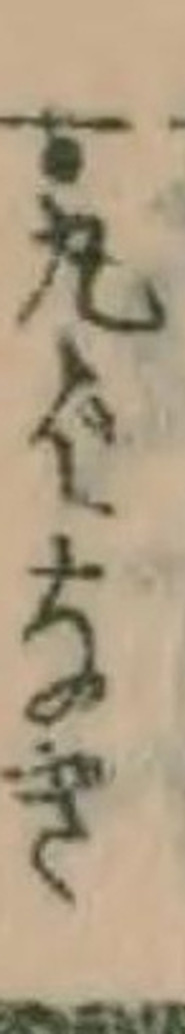・丸ばなぎ
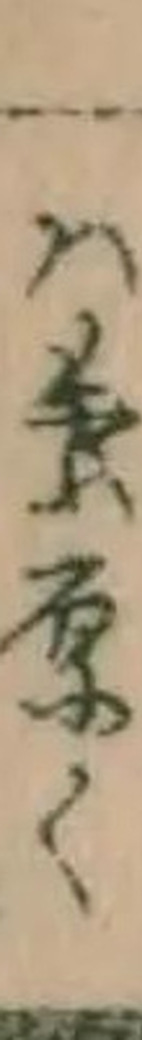は葉厚く
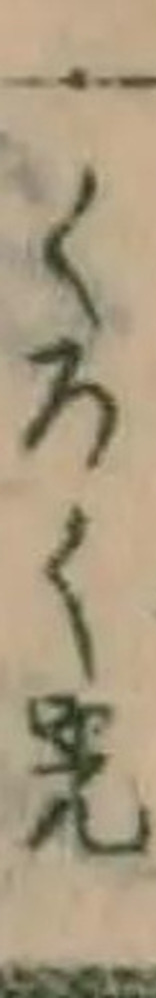くろく光
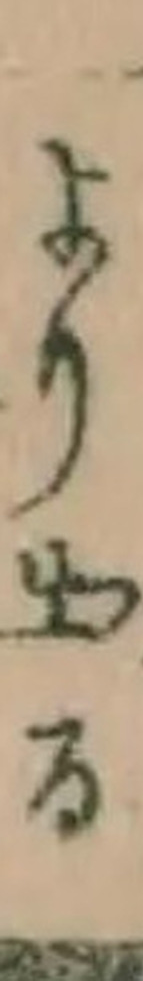より出る
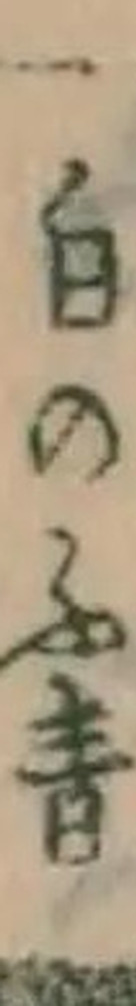白のふ青
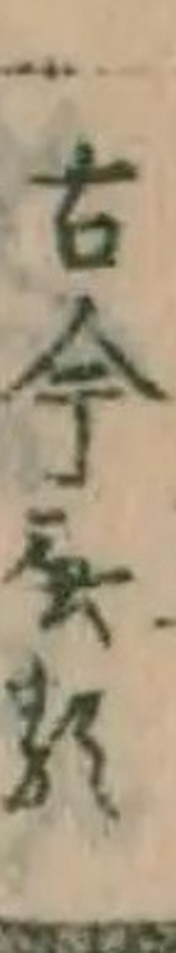古今無類
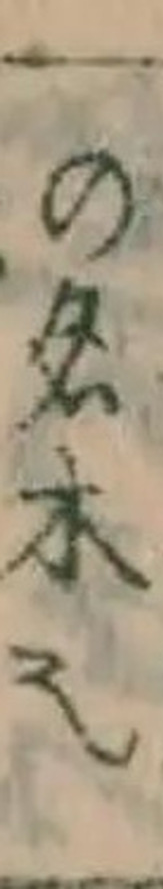の名木也
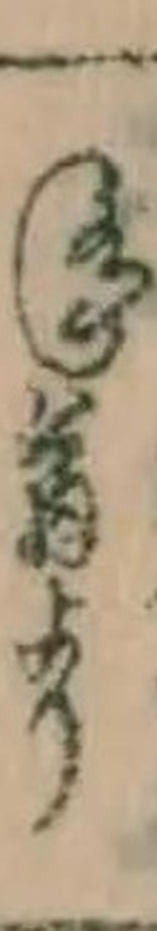水の翁より
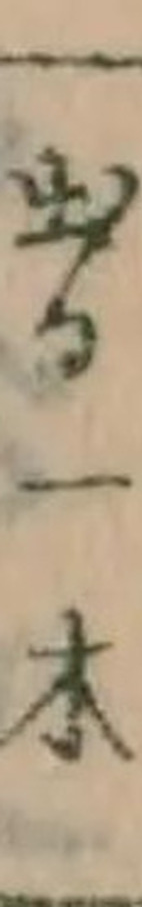出る一木
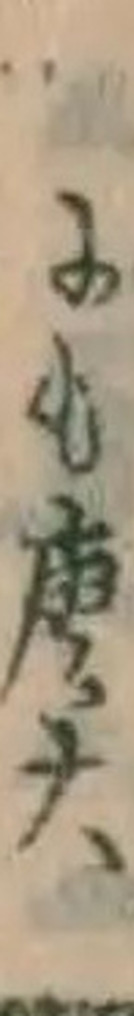にも唐大
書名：草木奇品家雅見 3巻. [3]
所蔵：国立国会図書館 National Diet Library, JAPAN
